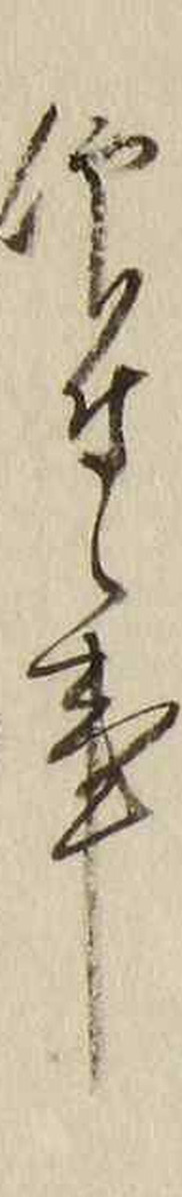仰付候事
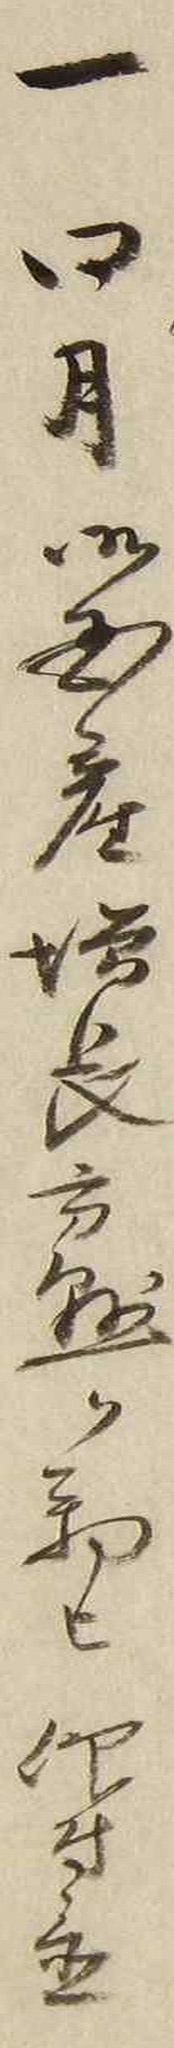一同月御国産増長方懸り勤被仰付候置

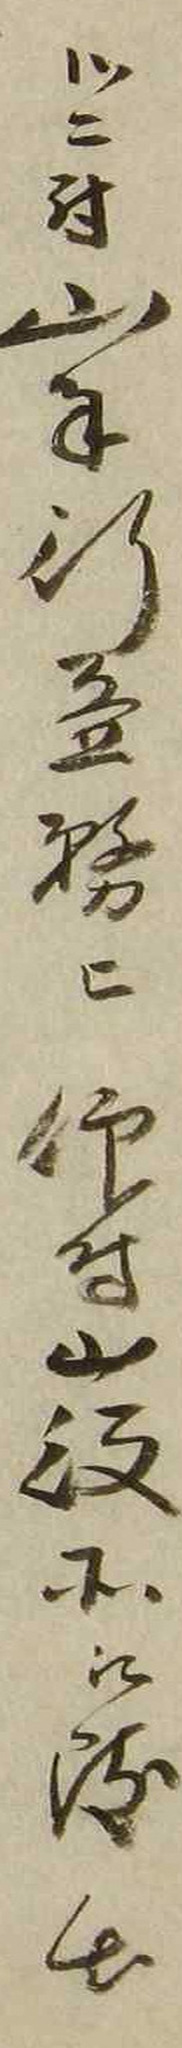候ニ付山奉行兼務被仰付山役所江致出
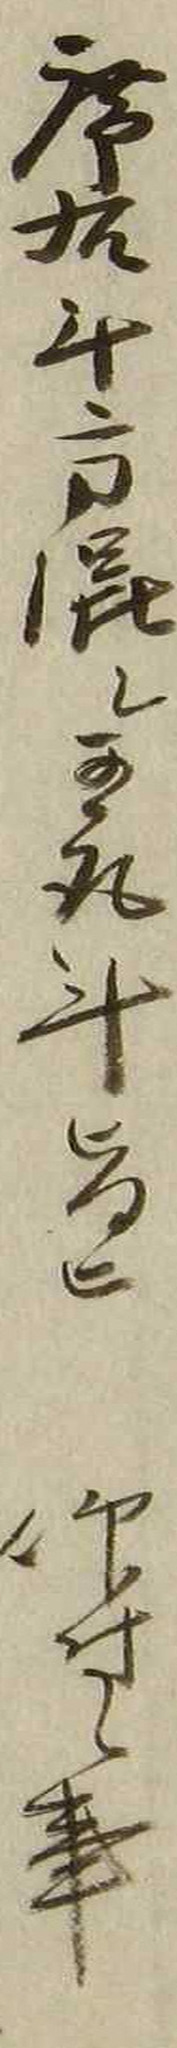席右計方混シ可取計旨被仰付候事
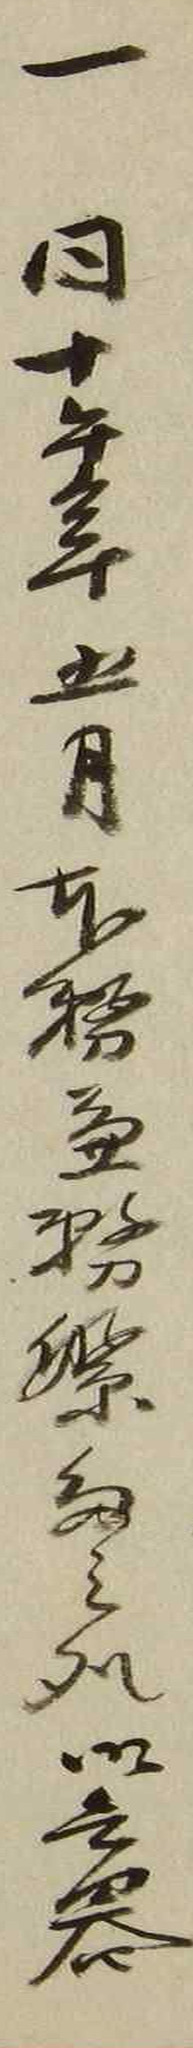一同十午年五月本務兼務繁多之処御兵器
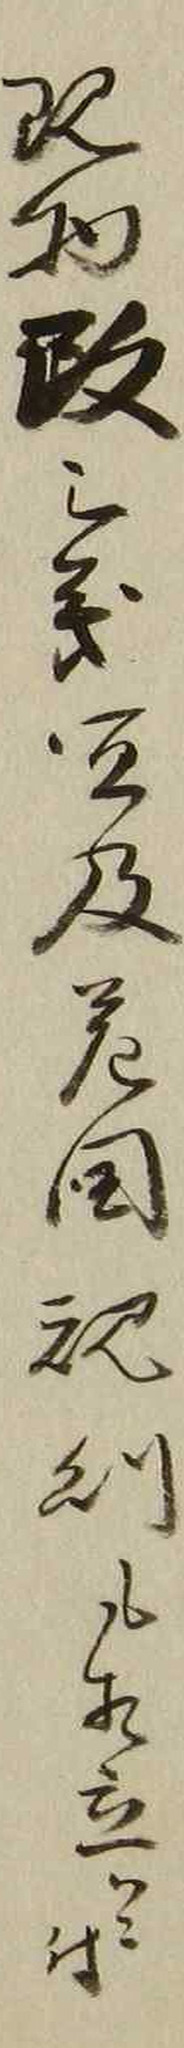現物改之義宜及差図規則も相立候ニ付
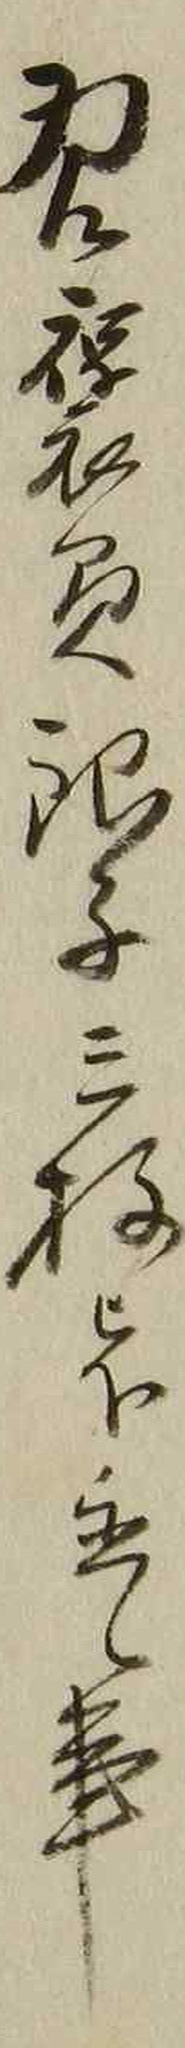為御褒美銀子三枚被下置候事
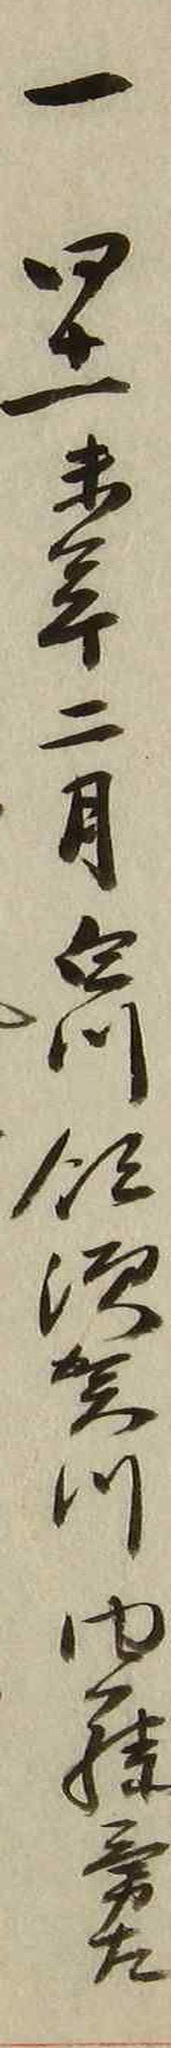一同十一未年二月白川領須賀川内藤勇左
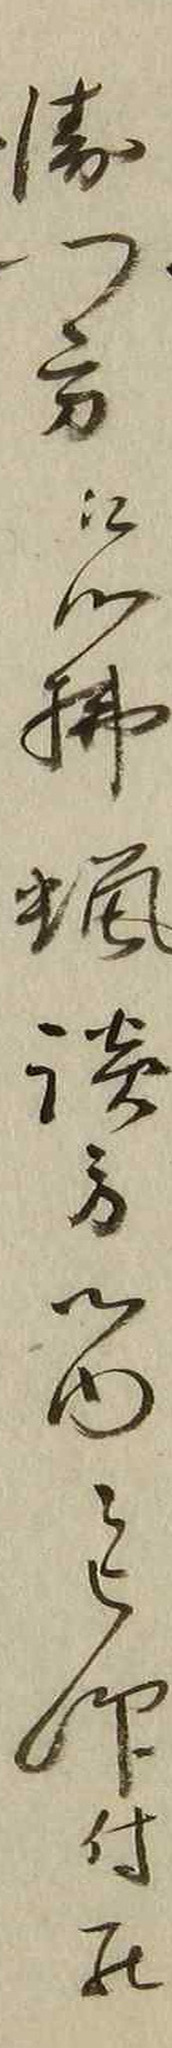衛門方江御払蝋談方御内々被仰付罷
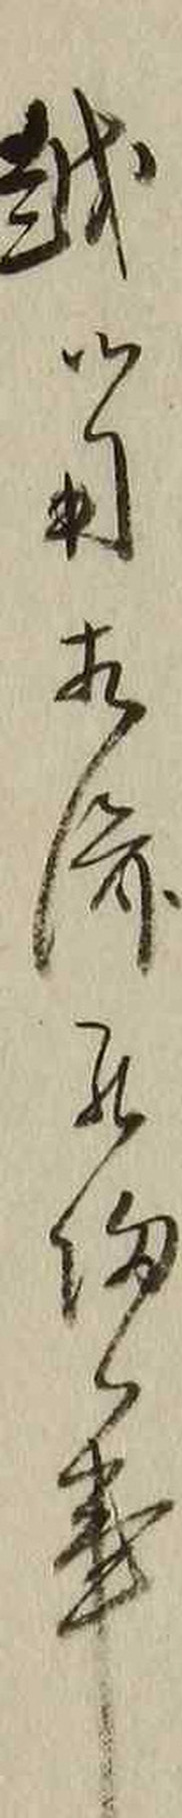越御用相済罷帰候事
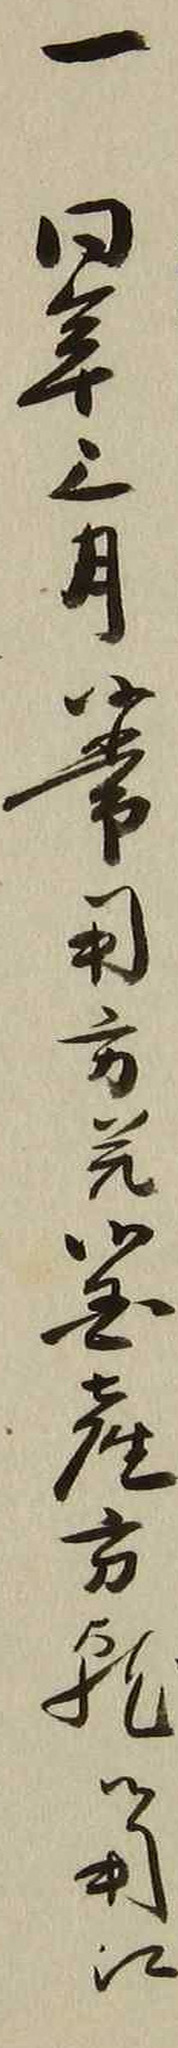一同年三月御常用方并御国産方就御用江
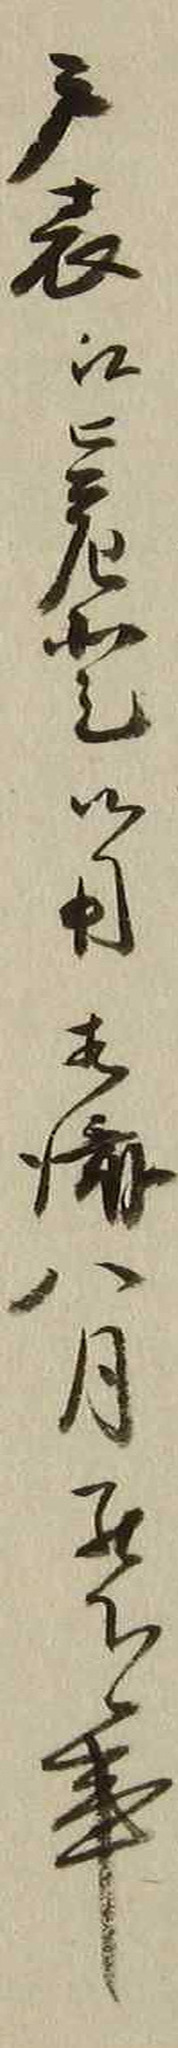戸表江被差登御用相済八月罷下候事
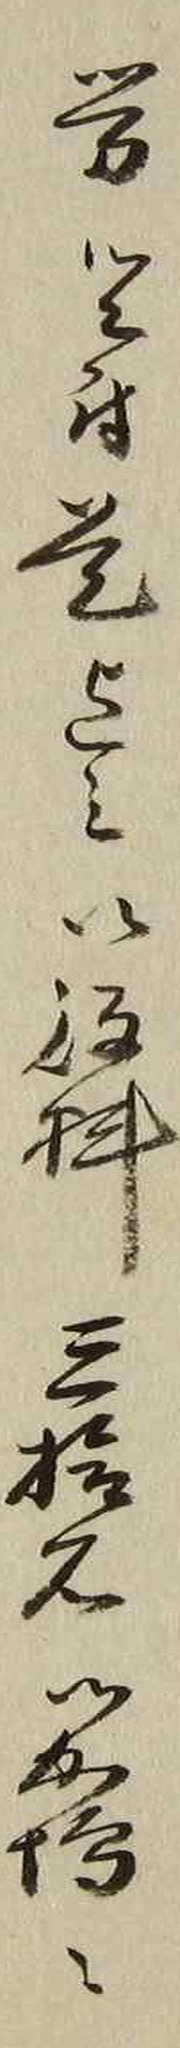労候ニ付是迄之御役料三拾石御加増ニ
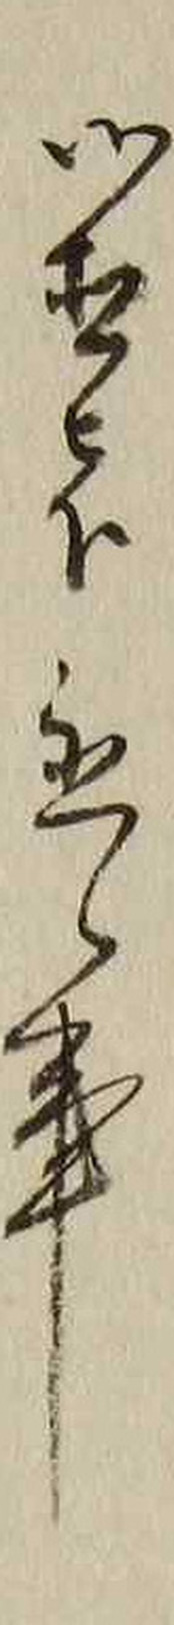御直被下置候事
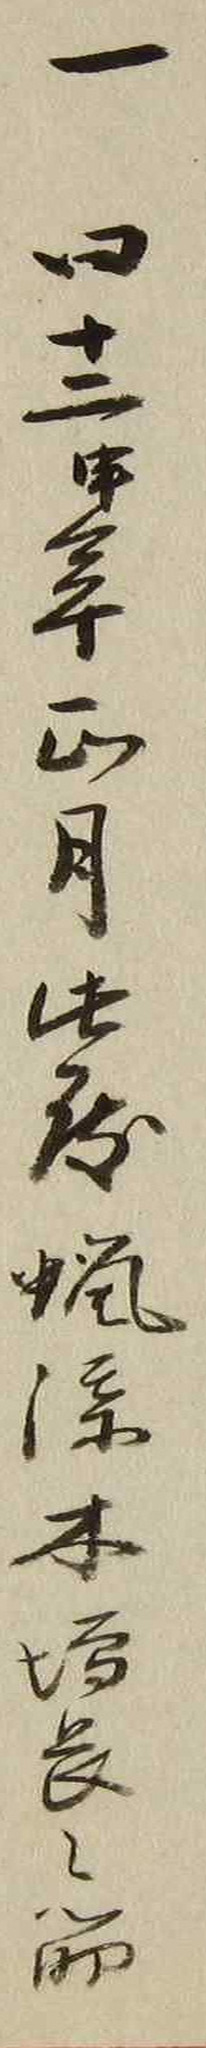一同十二申年正月此度蝋漆木増長之筋
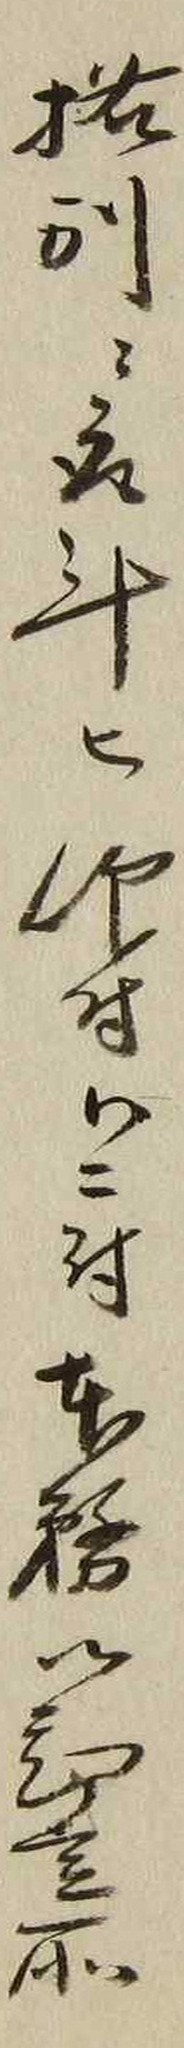格別ニ取計被仰付候ニ付本務御勘定所
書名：諸士系譜　巻之311　し之部1
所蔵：会津若松市立会津図書館
